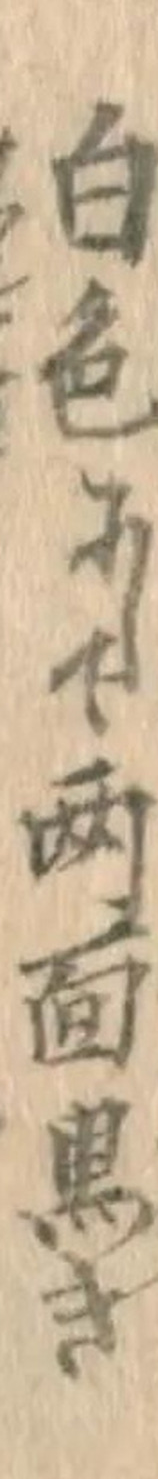白色にして両面黒き
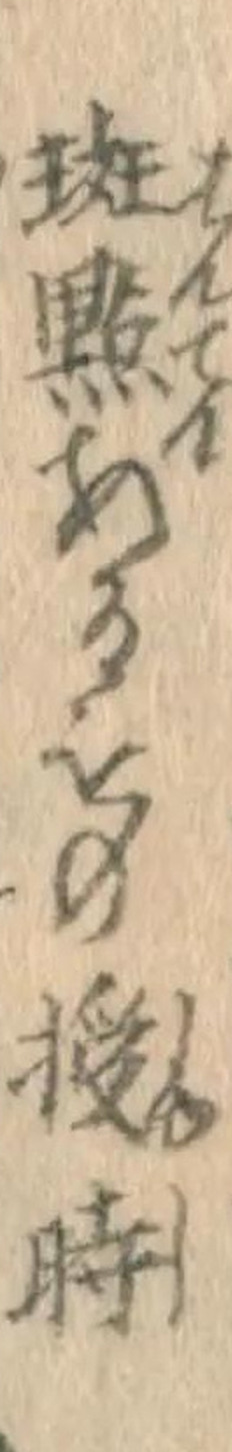斑点あるもの授時
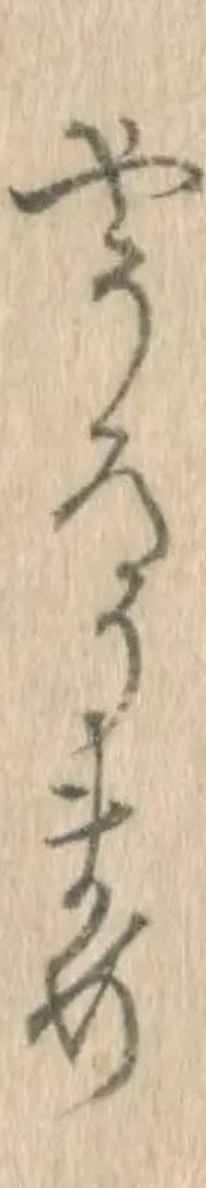やうろうまめ
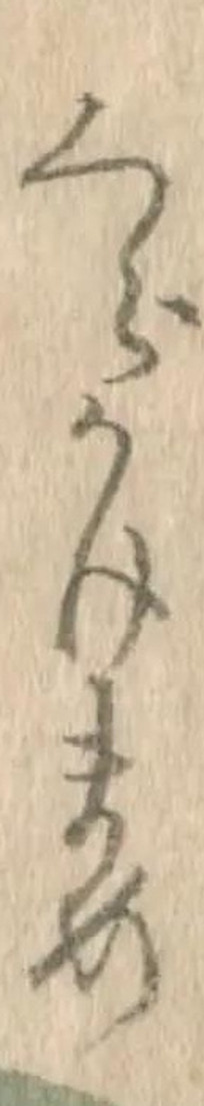くらかけまめ
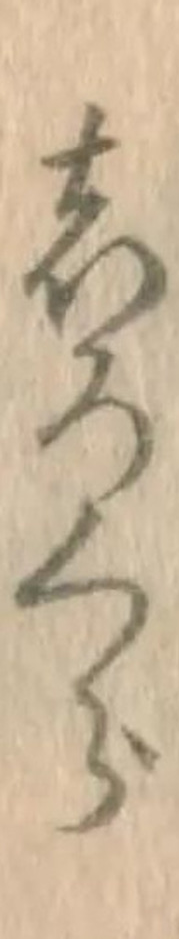しろくら
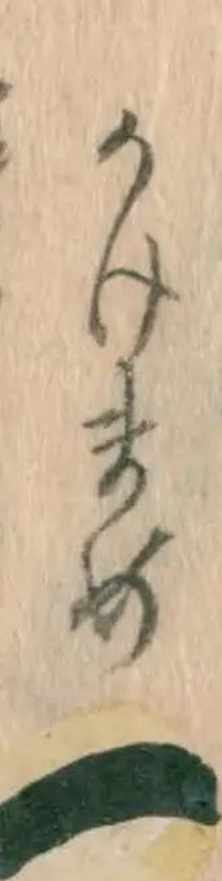かけまめ
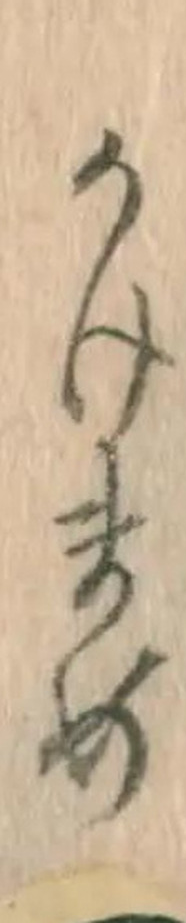かけまめ
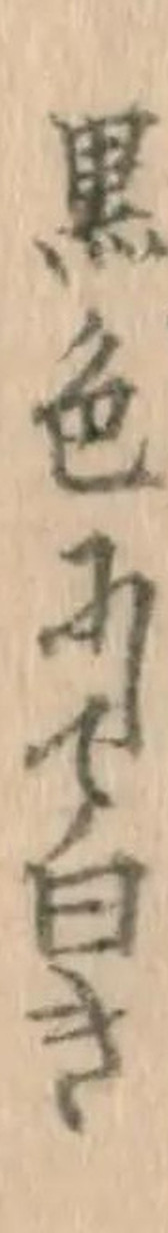黒色にして白き
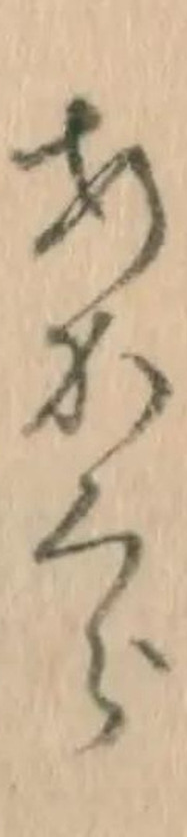あかくら
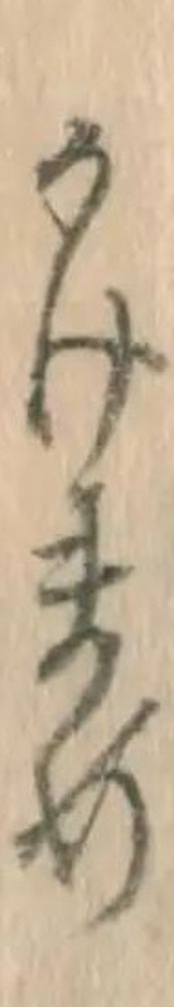かけまめ
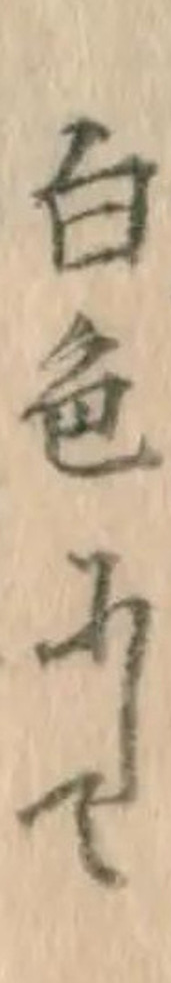白色にして

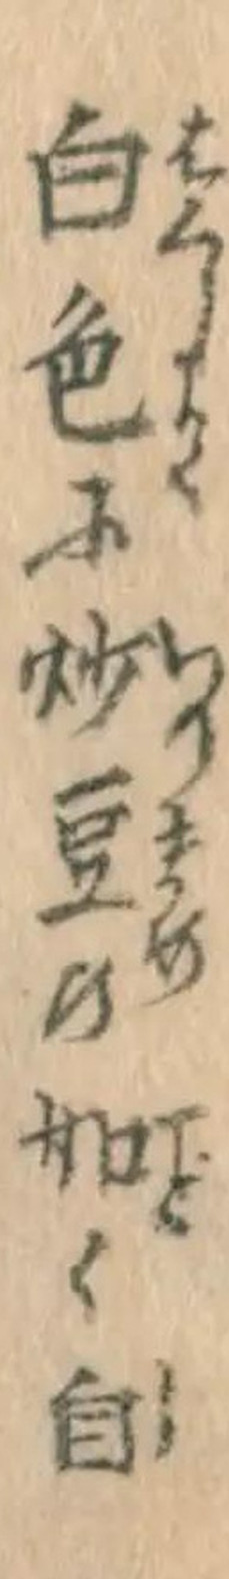白色に炒豆の如く自
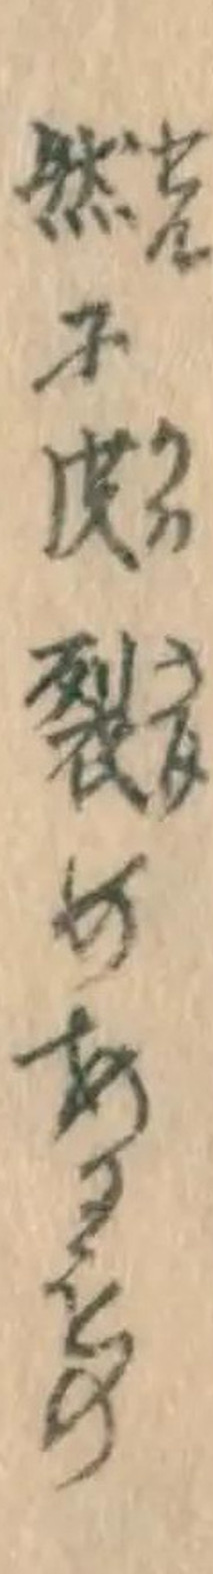然に皮裂めあるもの
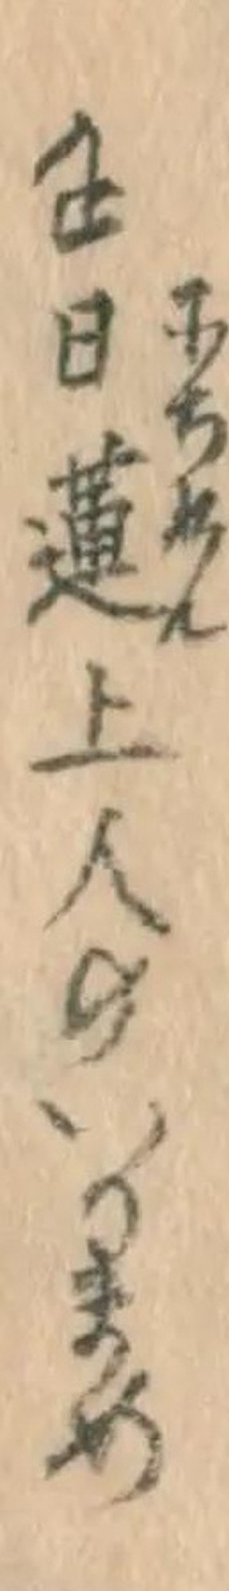を日蓮上人のいりまめ
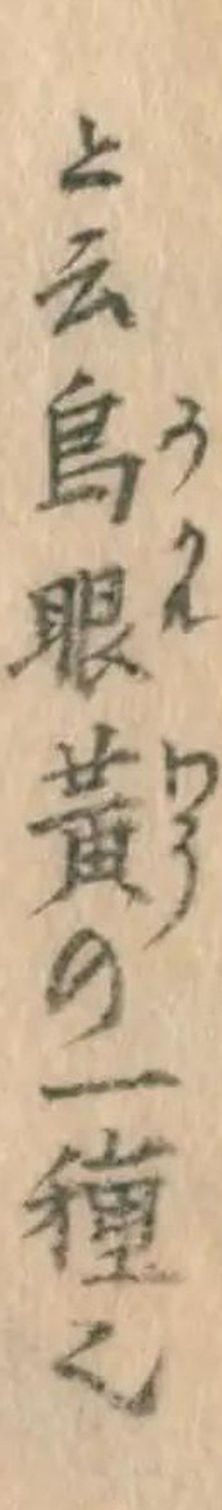と云烏眼黄の一種也
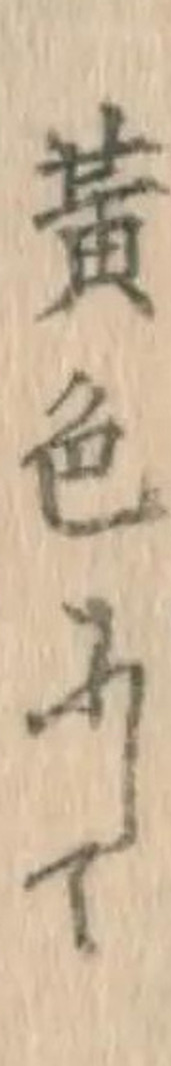黄色にして
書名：本草図譜. 巻43-45
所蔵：国立国会図書館 National Diet Library, JAPAN
